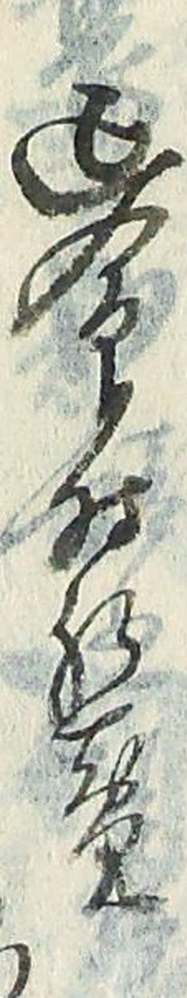延命村肝煎
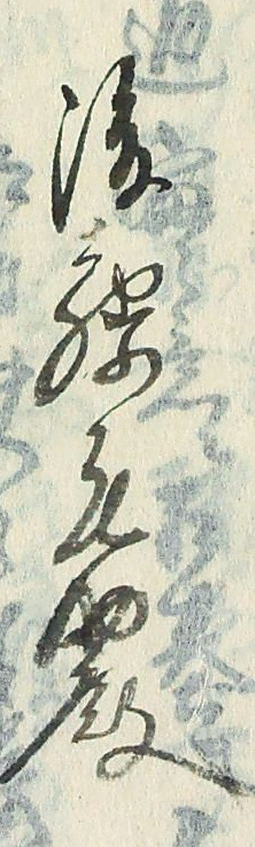後藤庄助殿
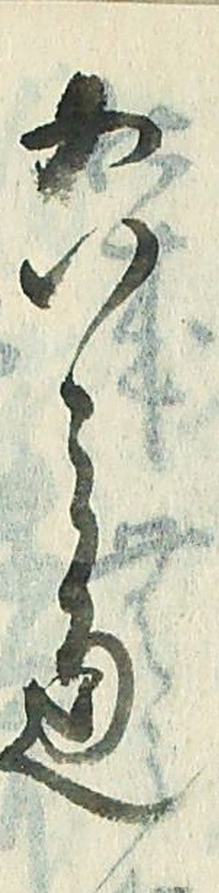右之通
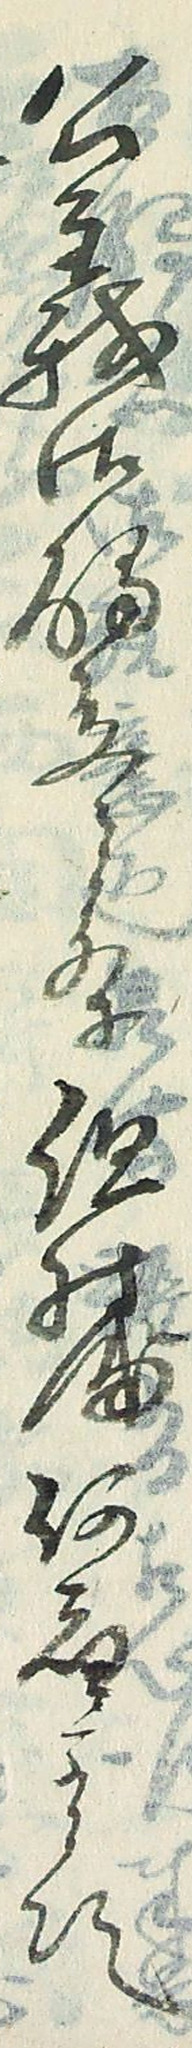公義御触有之候条組村浦何者によらす
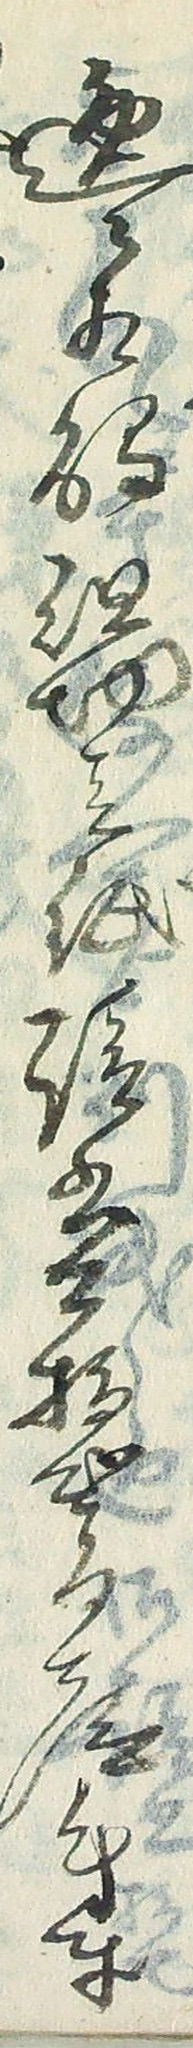逸々相触組切壱紙請書可指出旨被仰付奉
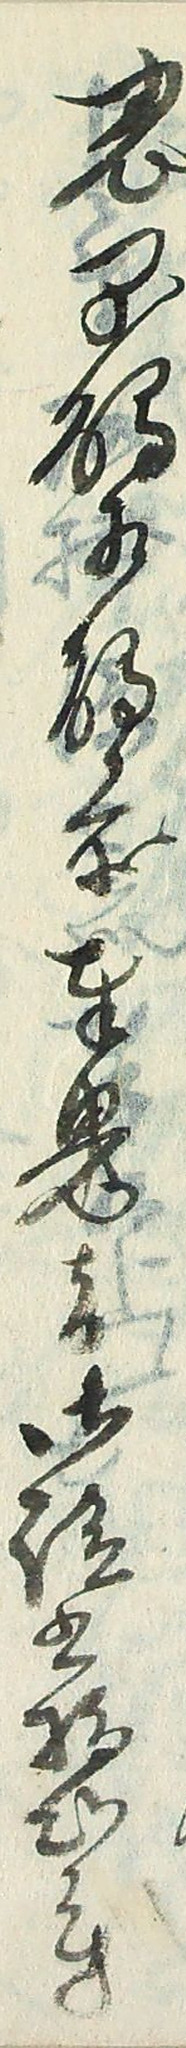畏早触相触候所奉畏旨御請書指出候付
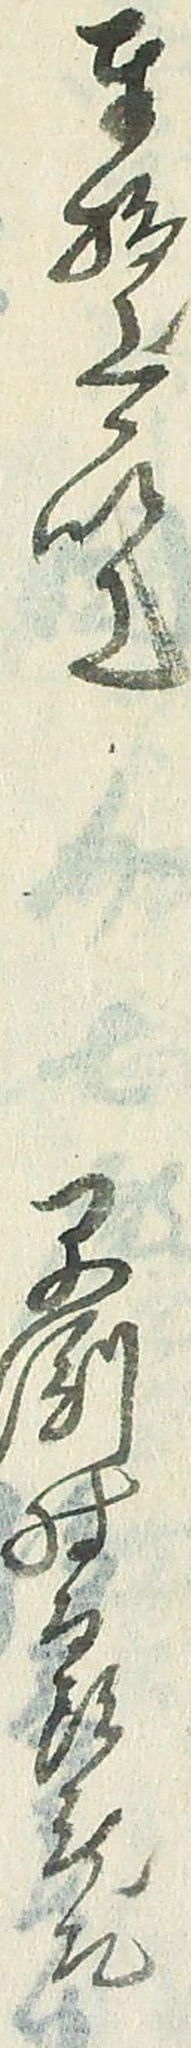奉指上候以上早淵村与頭庄屋
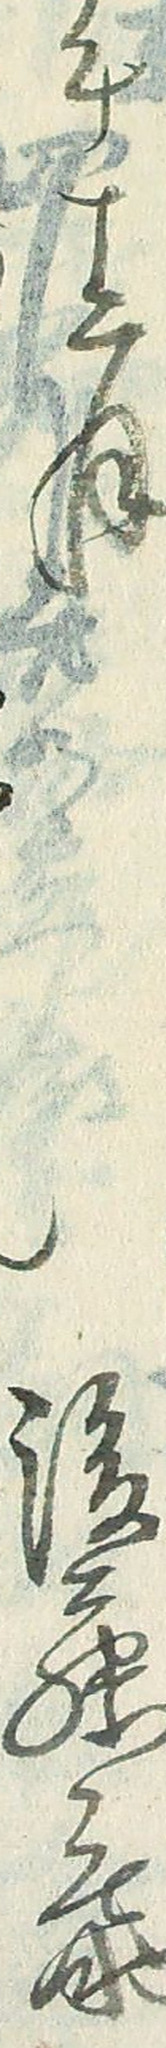午十二月後藤庄助
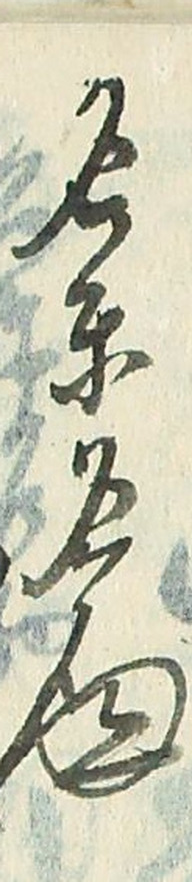名東名西
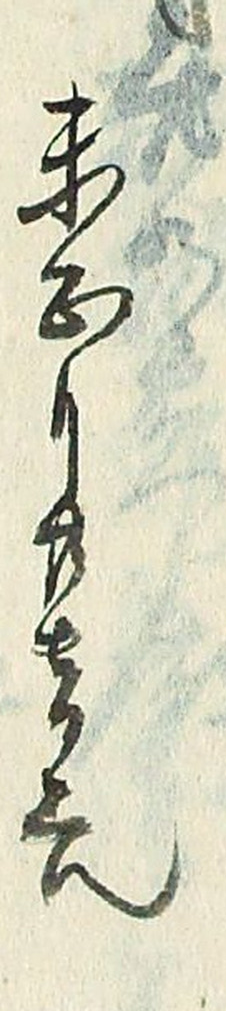未正月廿七日上る
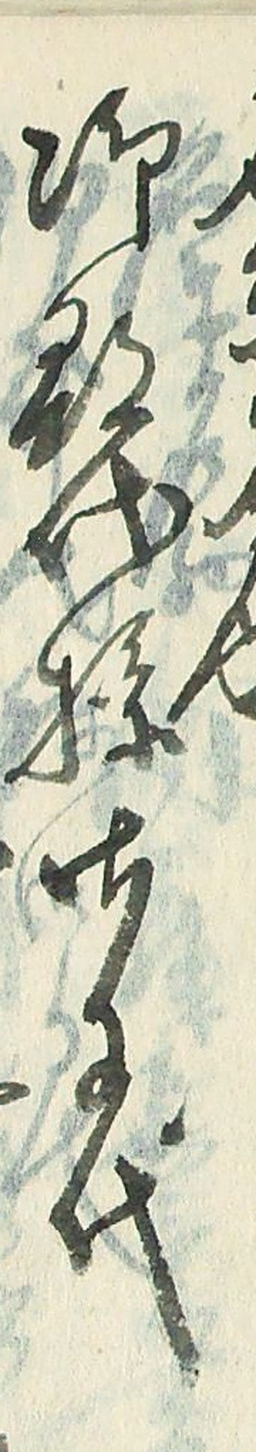御郡代様御手代
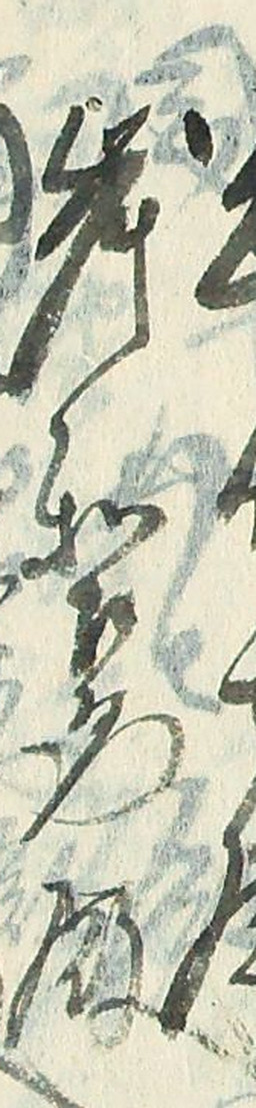岸和左衛門殿

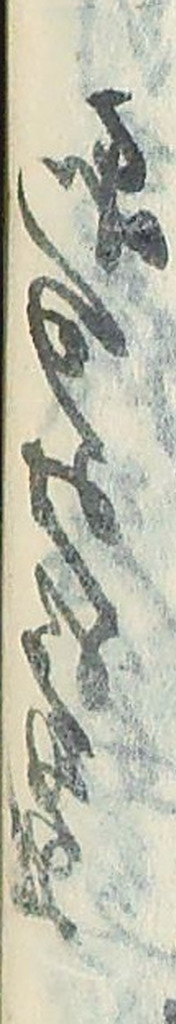四月廿九日
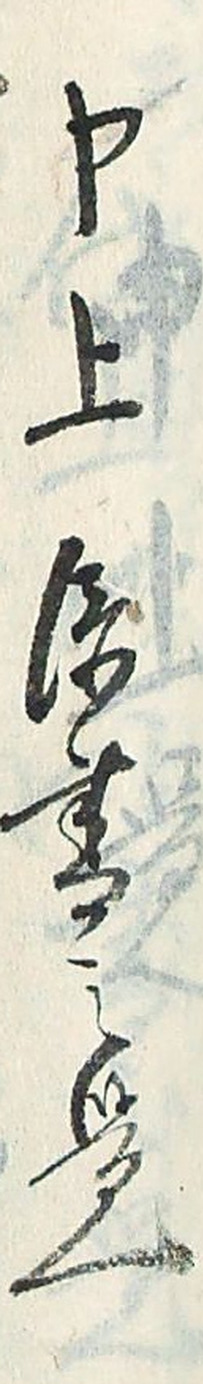申上添書之覚
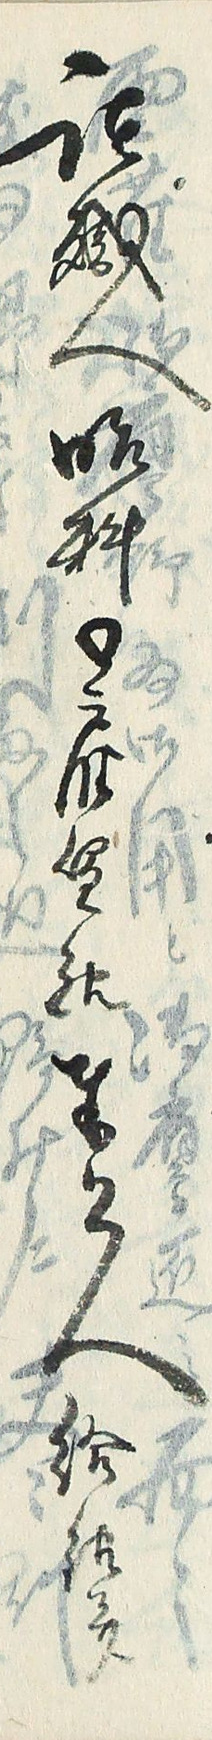諸職人昨料御雇賃金奉公人給銀幷
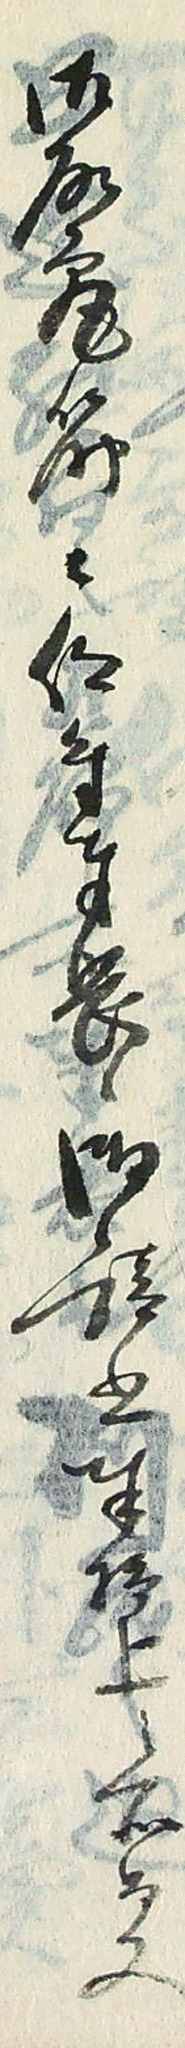御取究筋被仰付奉畏御請書奉指上候所尚又
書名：諸御用御□受書控
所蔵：鳴門教育大学 Naruto University of Education
